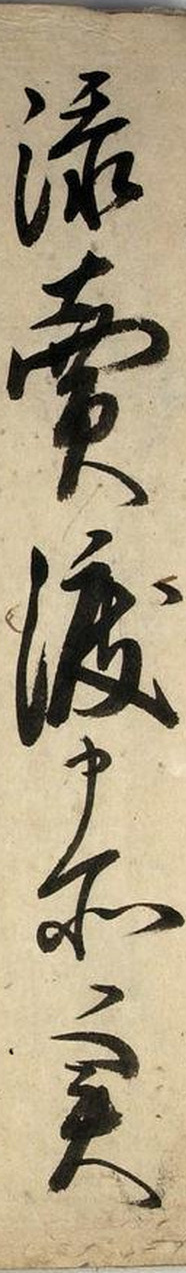添売渡申所実
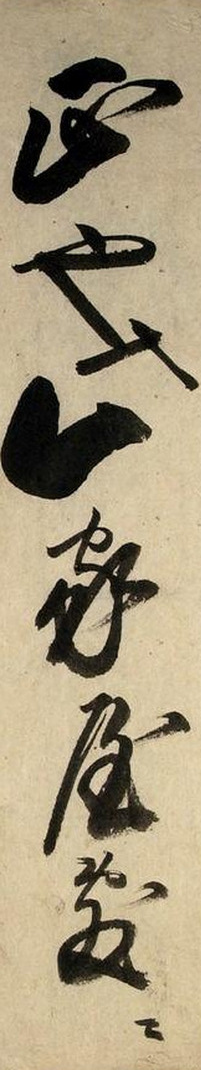正也此家屋敷に
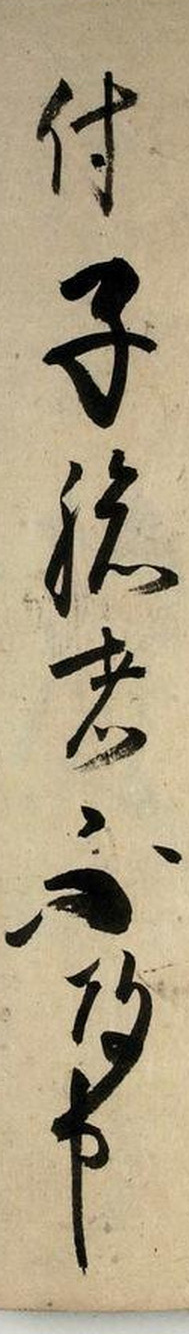付子孫は不及申
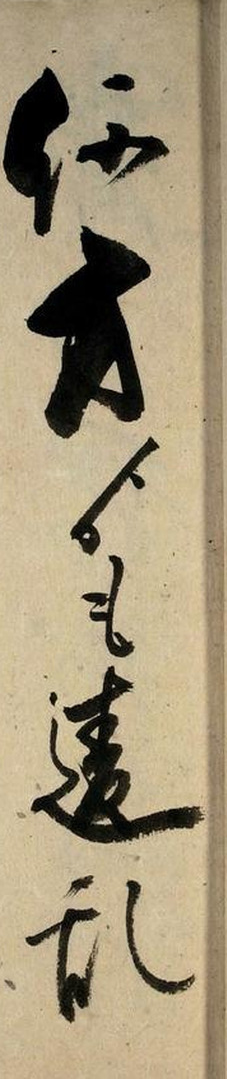何方よりも違乱
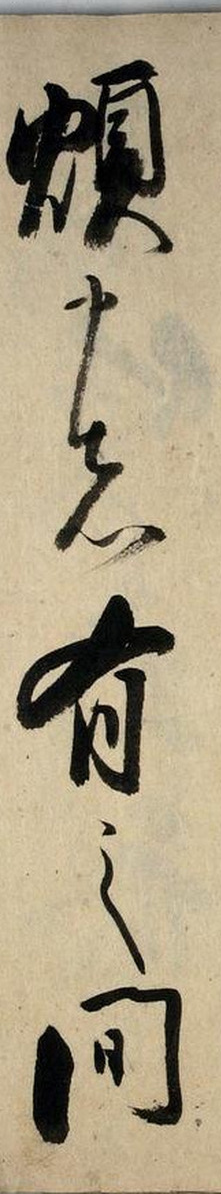煩申者有之間
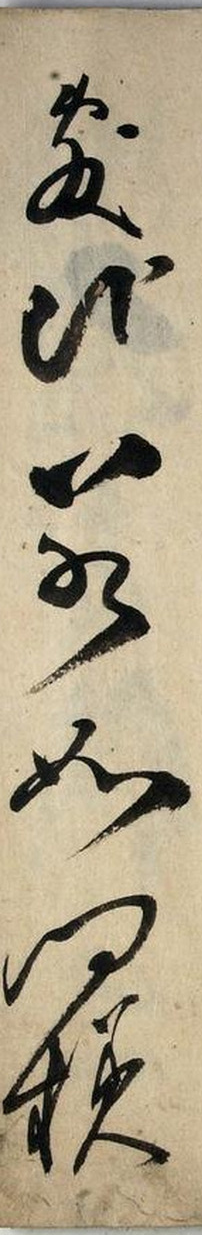敷候若如同様

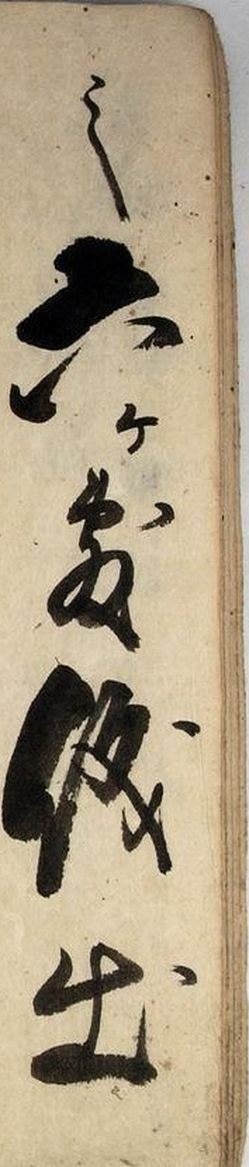之六ケ敷儀出
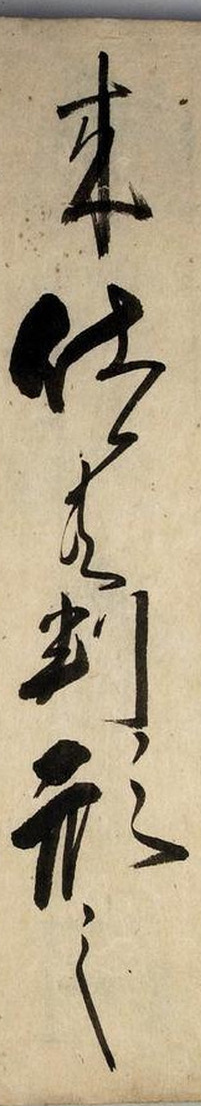来仕候共判形之
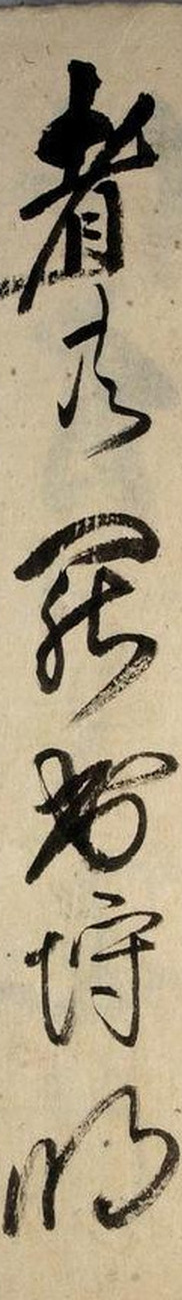者共罷出埒明
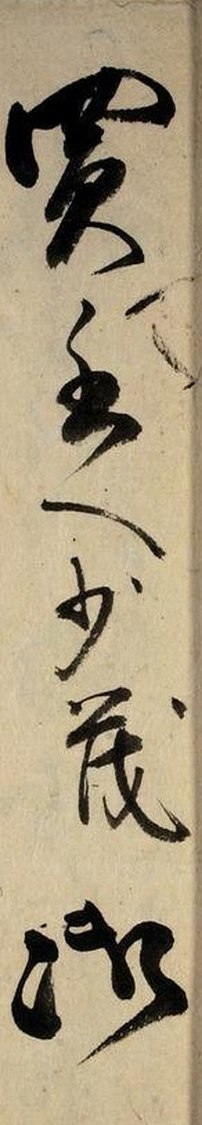買主へ少も御
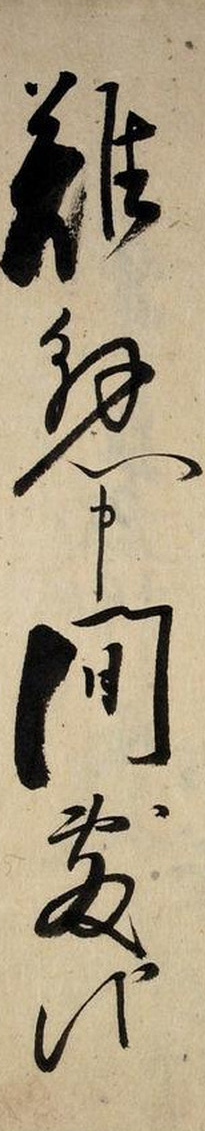難懸申間敷候
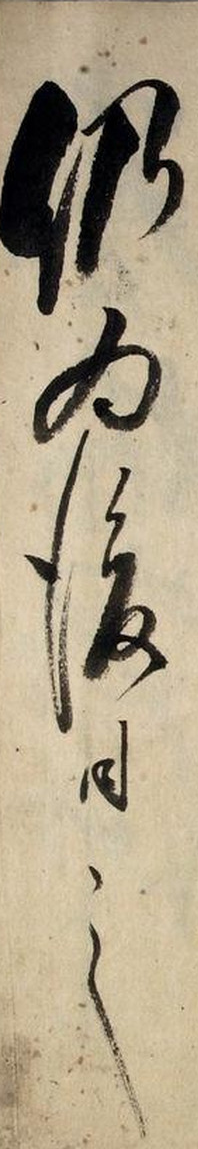仍為後日之

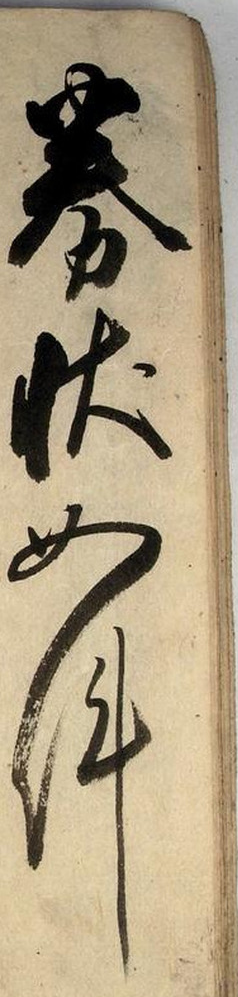券状如件
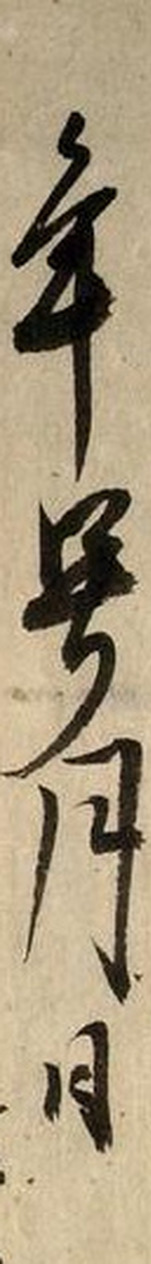年号月日
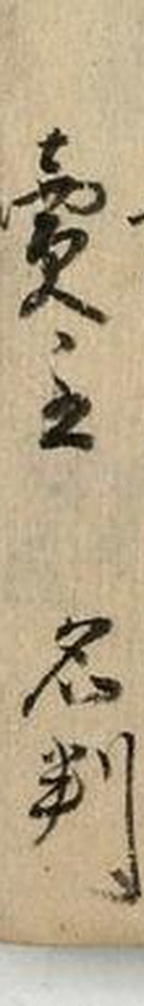売主名判
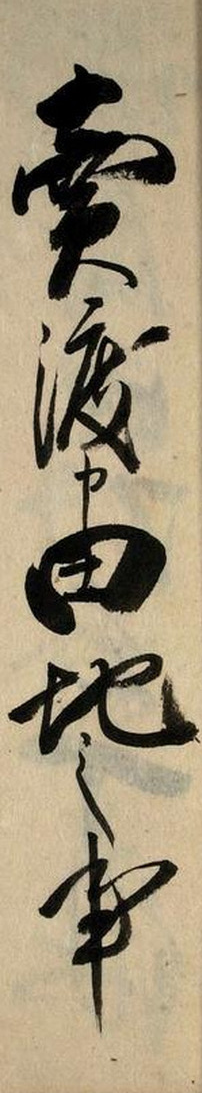売渡申田地之事
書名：御手本（手習、預リ申銀子之事、売渡申家屋敷事ほか）
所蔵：福井県文書館 Fukui Prefectural Archives
